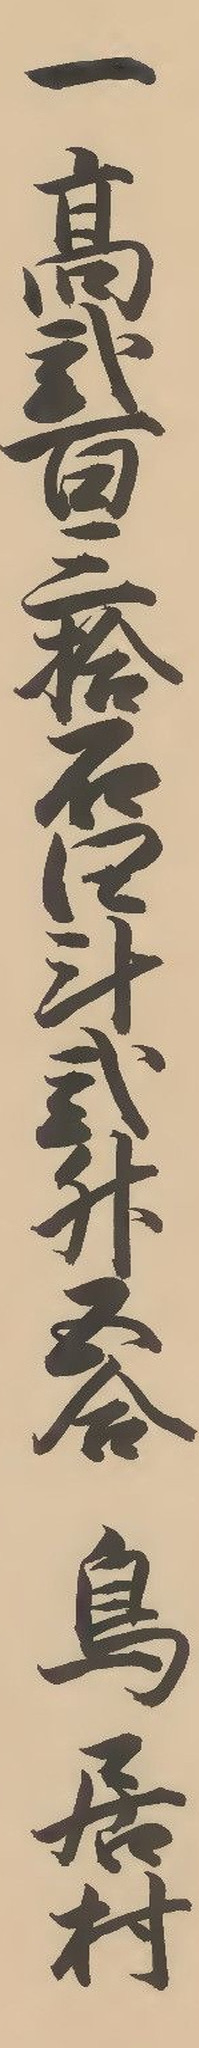一髙弐百三拾石四斗弐升五合鳥居村
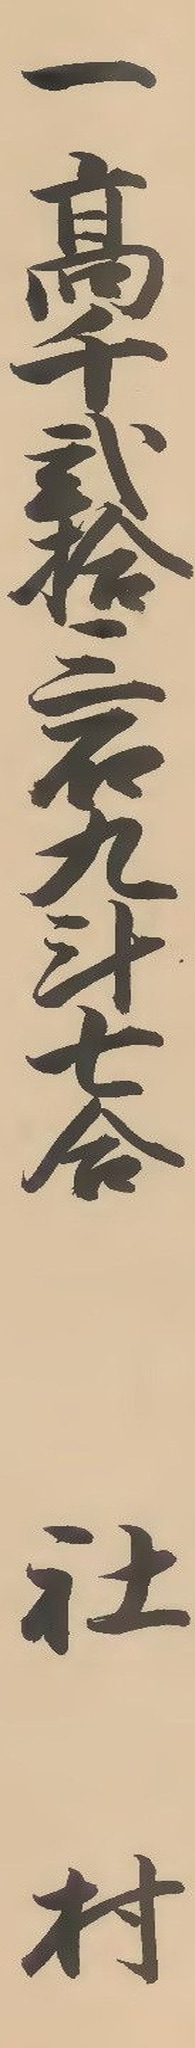一髙千弐拾三石九斗七合社村
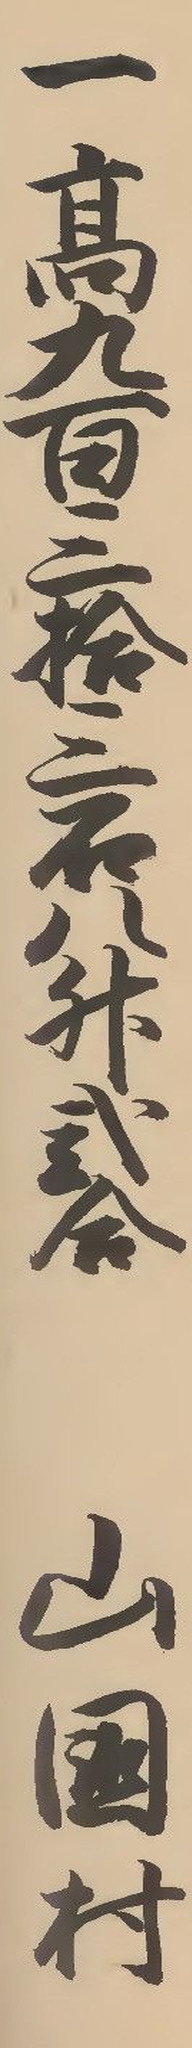一髙九百三拾三石八升弐合山國村
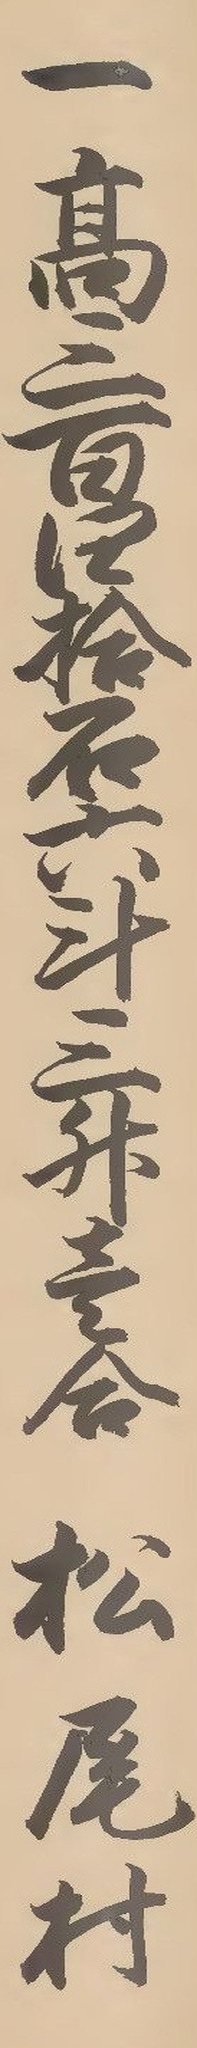一髙三百四拾石六斗三升壱合松尾村
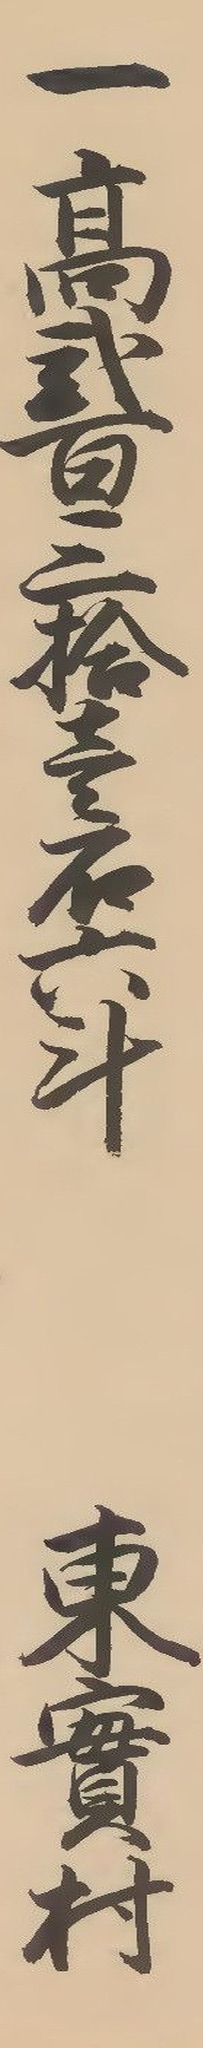一髙弐百三拾壱石六斗東實村
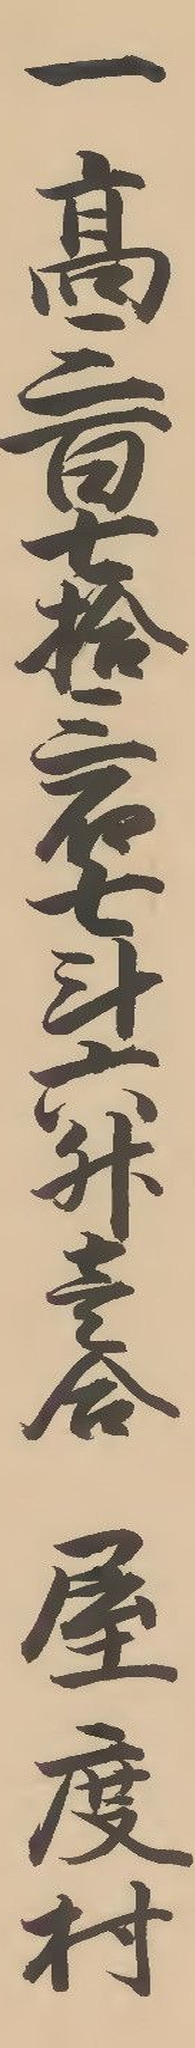一髙三百七拾三石七斗六升壱合屋度村

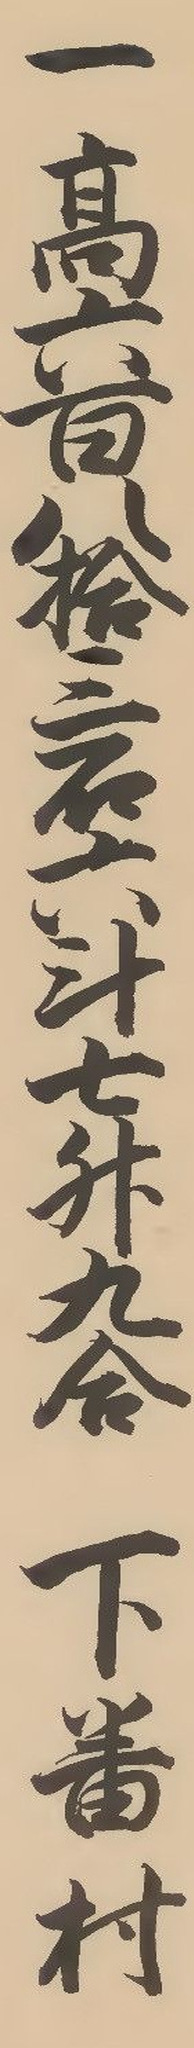一髙六百八拾三石六斗七升九合下番村
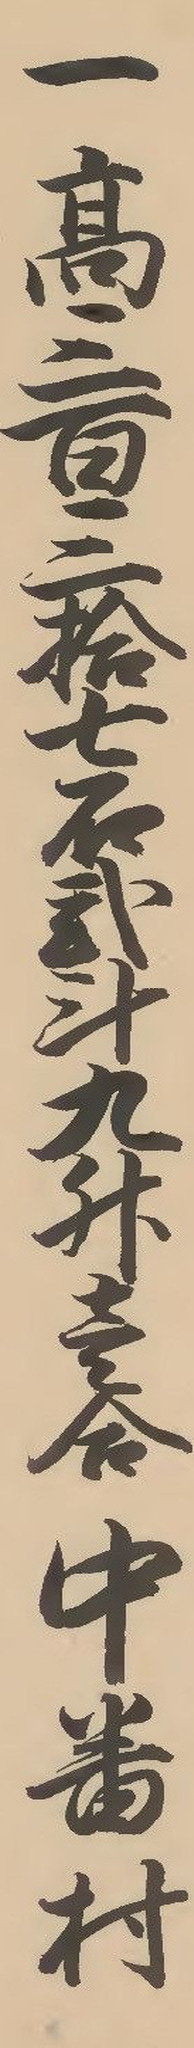一髙三百三拾七石弐斗九升壱合中番村
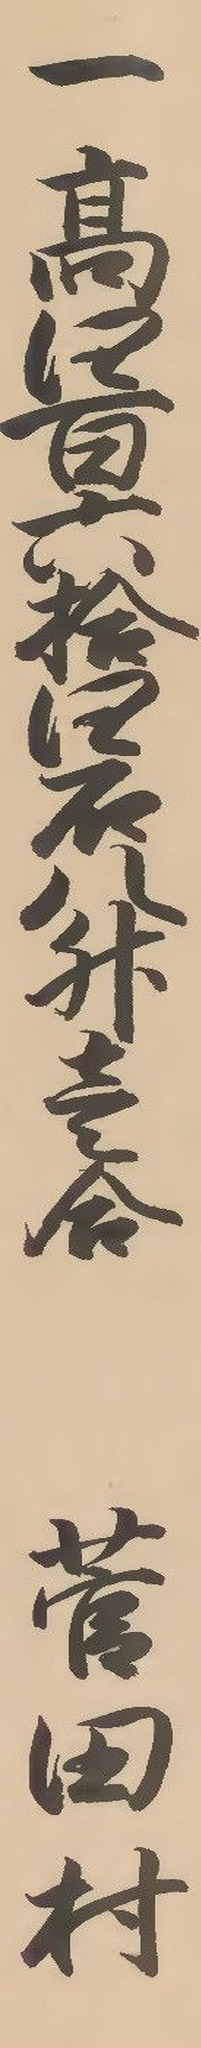一髙四百六拾四石八升壱合菅田村
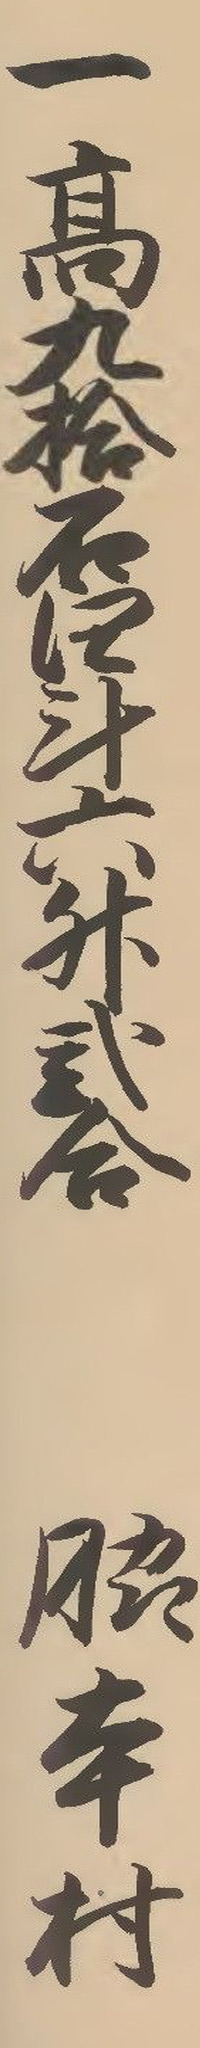一髙九拾石四斗六升弐合脇本村
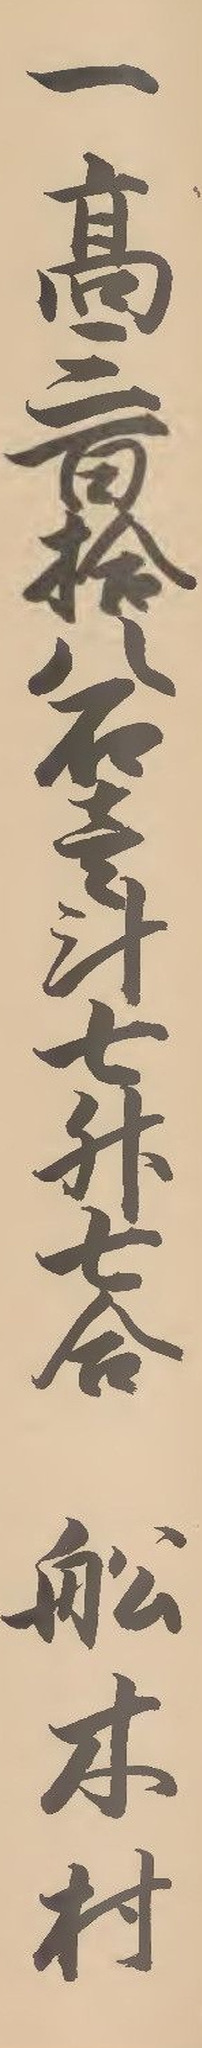一髙三百拾八石壱斗七升七合舩木村
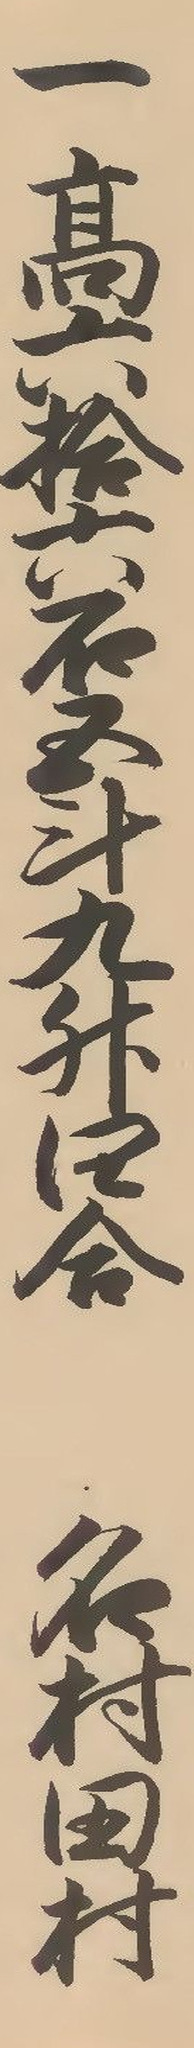一髙六拾六石五斗九升四合名村田村
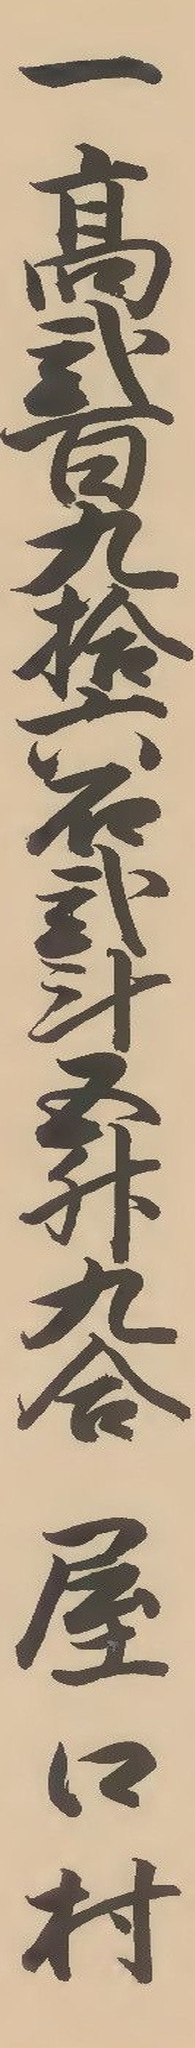一髙弐百九拾六石弐斗五升九合屋口村
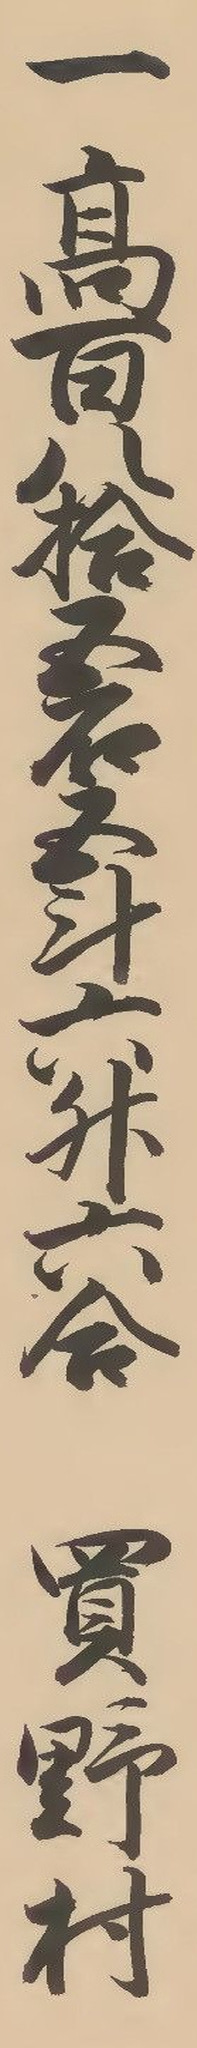一髙百八拾五石五斗六升六合買野村

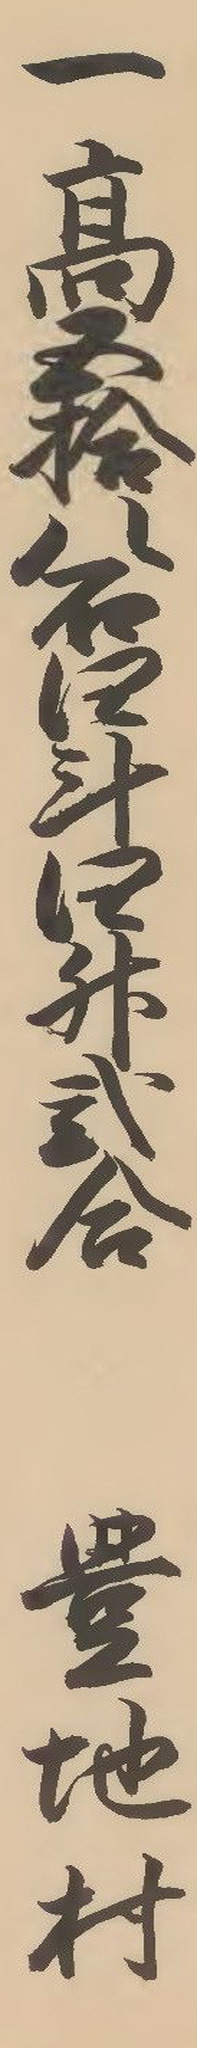一髙五拾八石四斗四升弐合豊地村
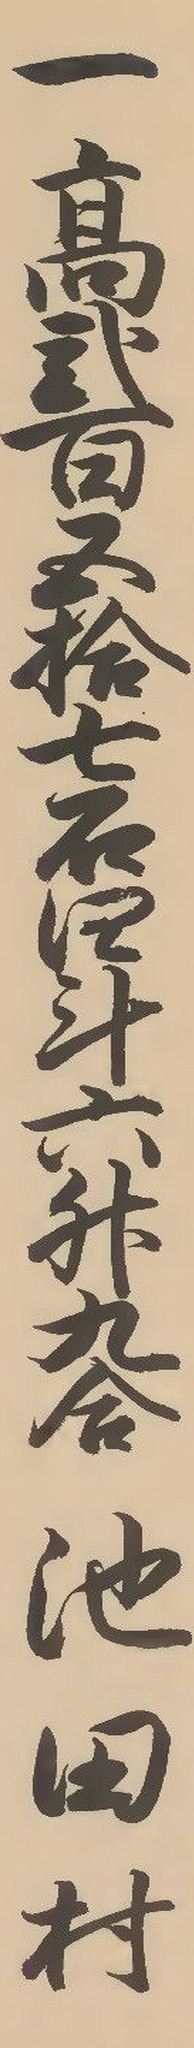一髙弐百五拾七石四斗六升九合池田村
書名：播磨国郷帳
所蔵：国立公文書館 National Archives of Japan
